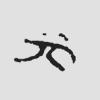亓（其）
